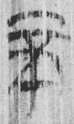不
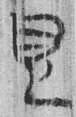見
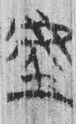○（吾）
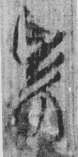○（奚）
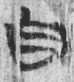自
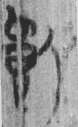飤
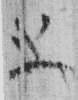之
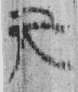亓（其）
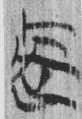○（來）
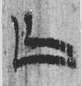亡（無）
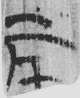厇（宅）
